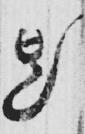也
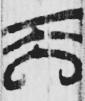而
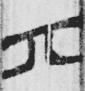亓（其）
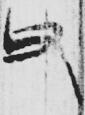父
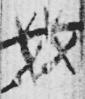戔（賤）
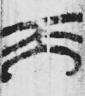而
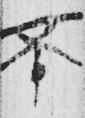不
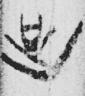足
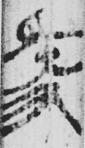爯（稱）
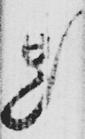也
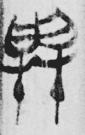與
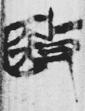殹（抑）
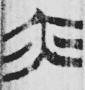亦
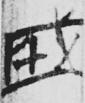城（誠）
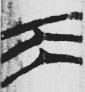天
